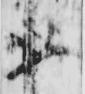之
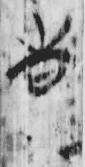告
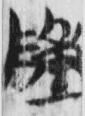○（陳）
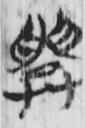興
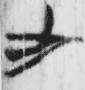之
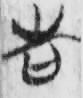告
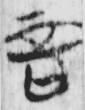言
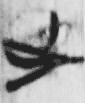之
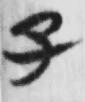子
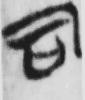司
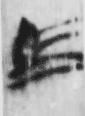馬
